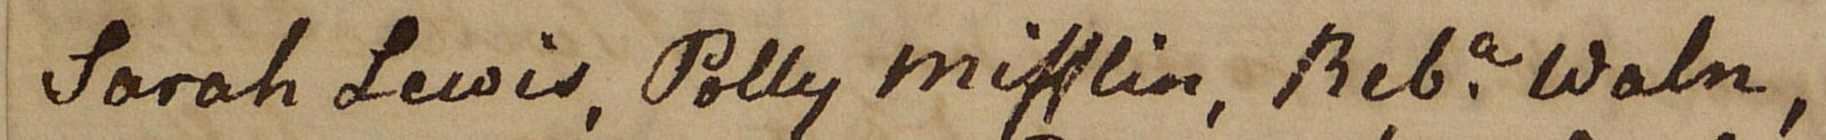Sarah Lewis, Polly Mifflin, Reb^a. Waln,
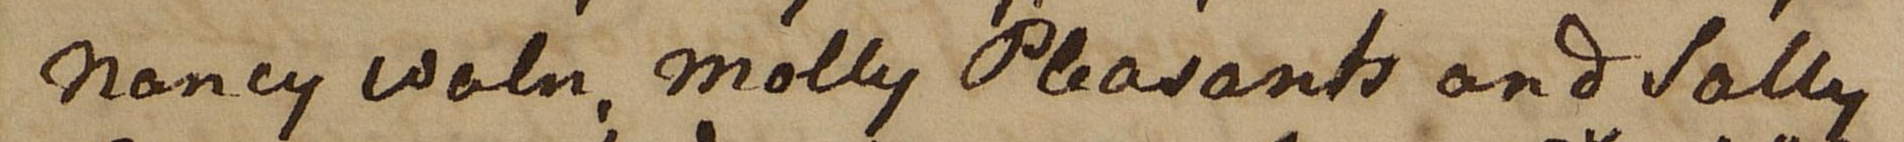Nancy Waln, Molly Pleasants and Sally
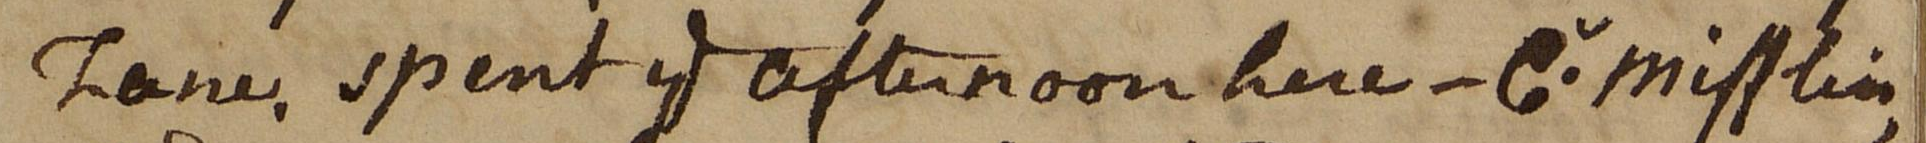Zane. spent y^e afternoon here- C^s. Mifflin,
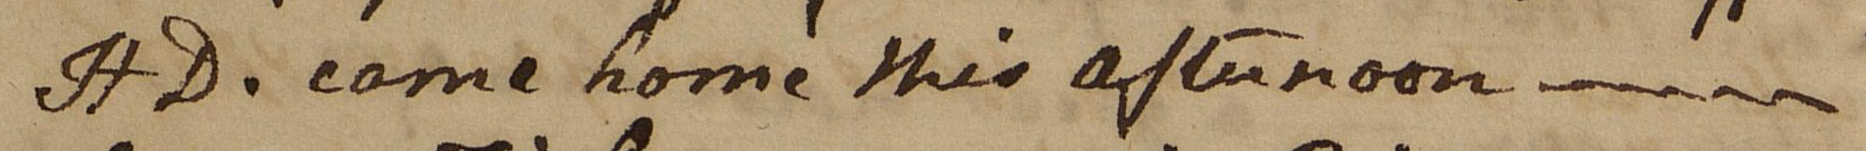HD. came home this afternoon--
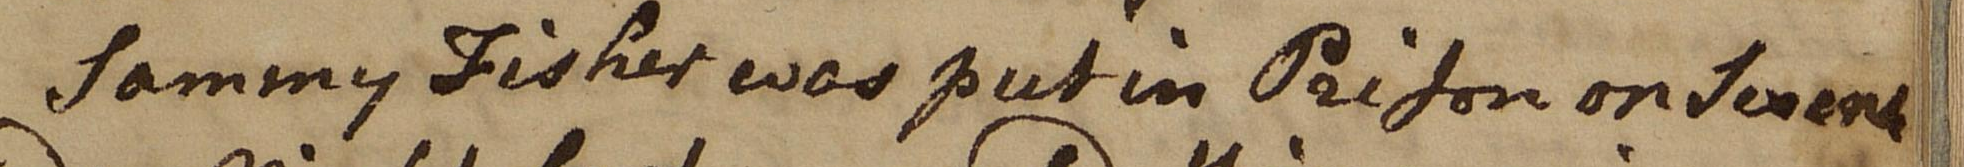Sammy Fisher was put in Prison on Sevent
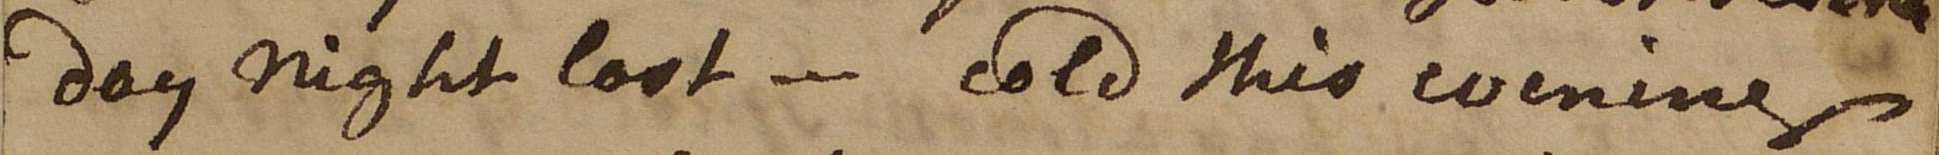day night last- cold this evening
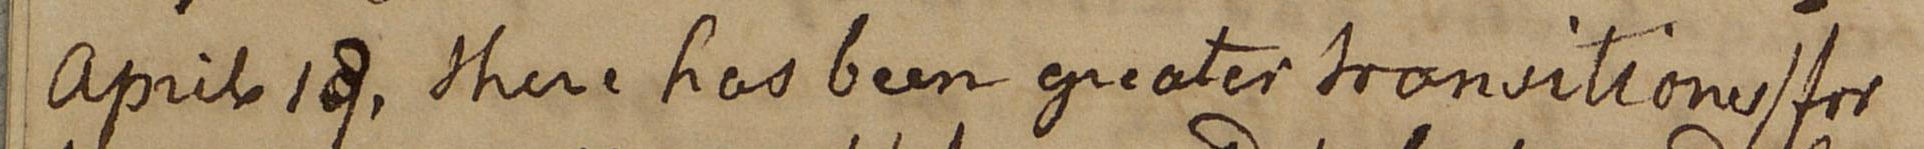April 18, there has been greater transitions /for
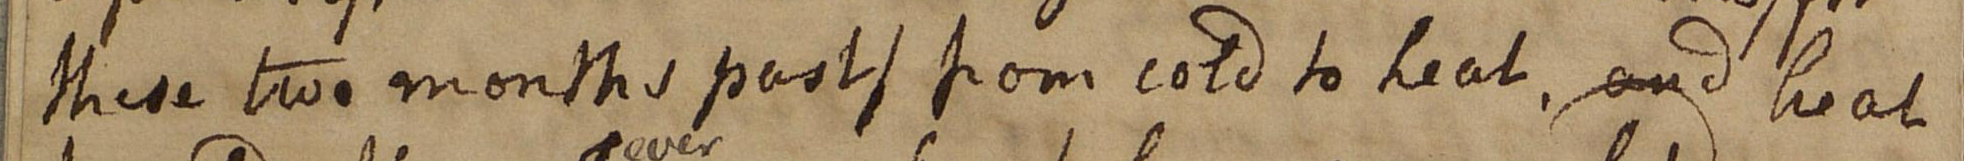these two months past/ from cold to heat, and heat
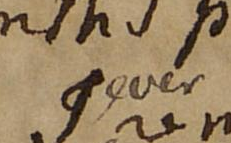ever
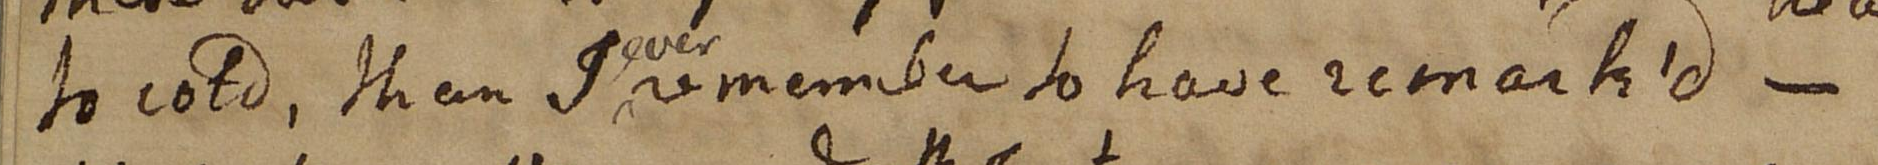to cold, than I ^ remember to have remark'd-
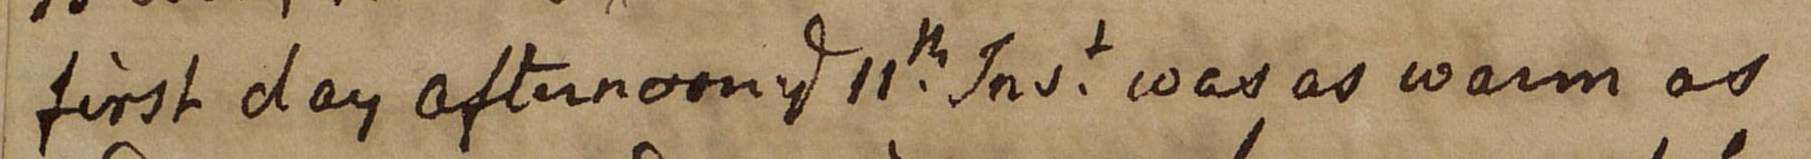first day afternoon y^e 11^th. Ins^t. was as warm as
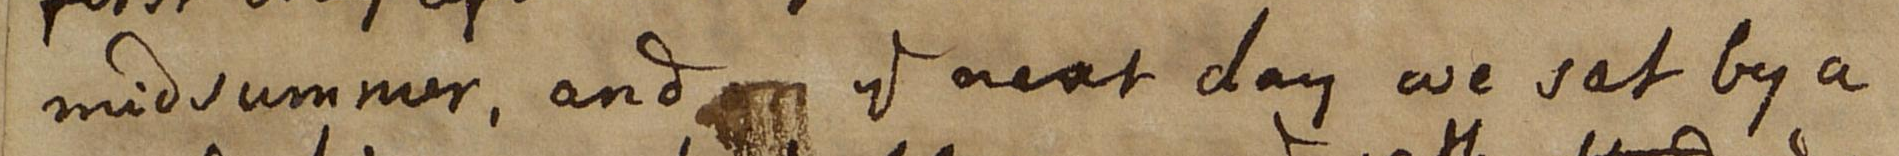midsummer, and on y^e next day we set by a
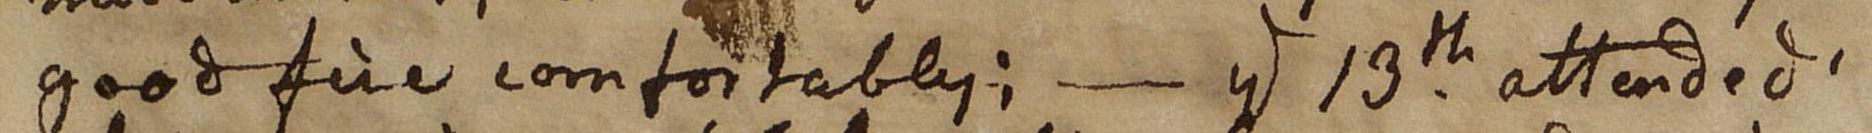good fine comfortably;- y^e 13^th. attended
